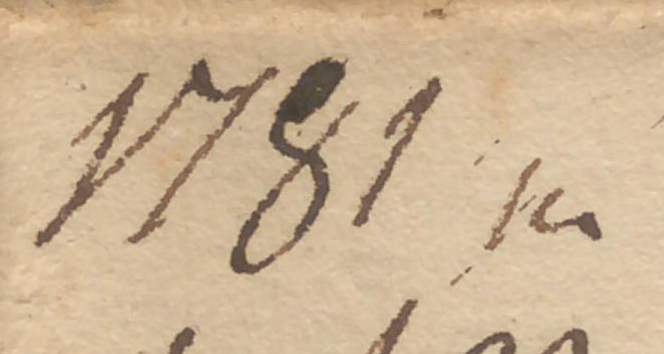1781
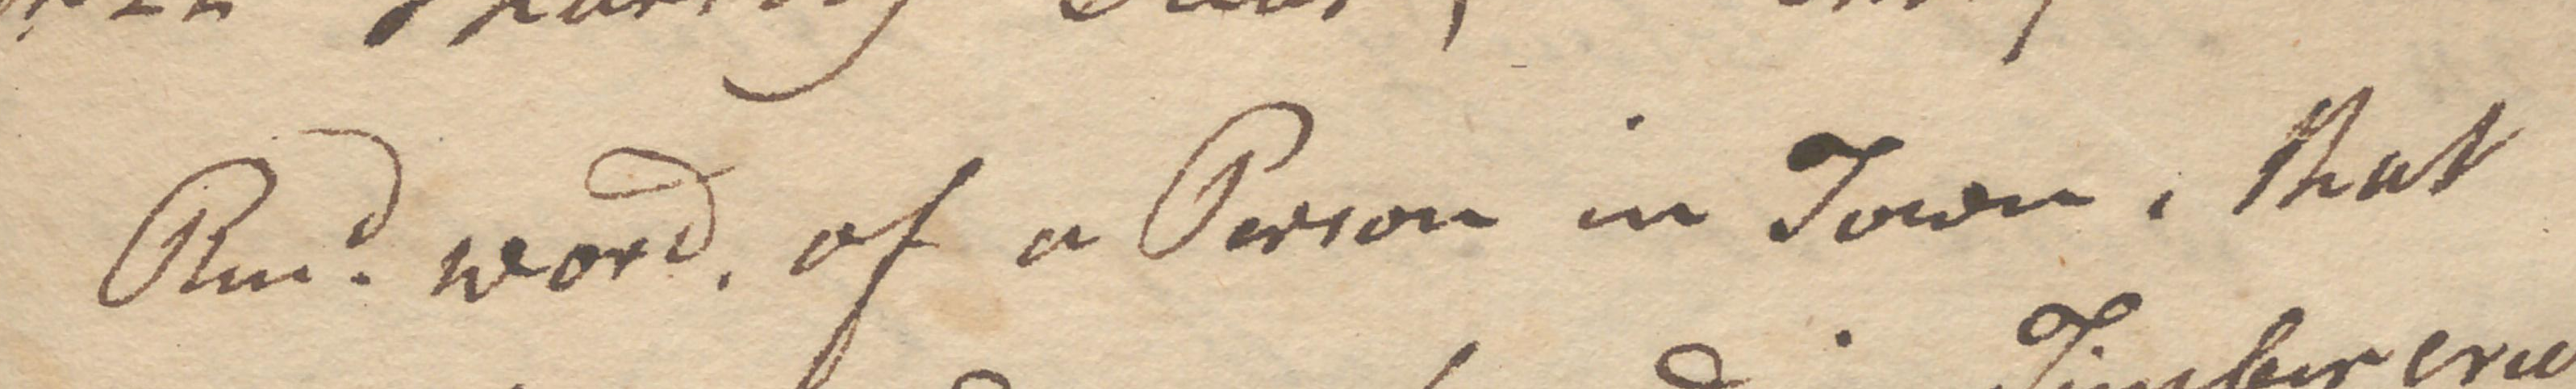Rec^d. word. of a Person in Town, that
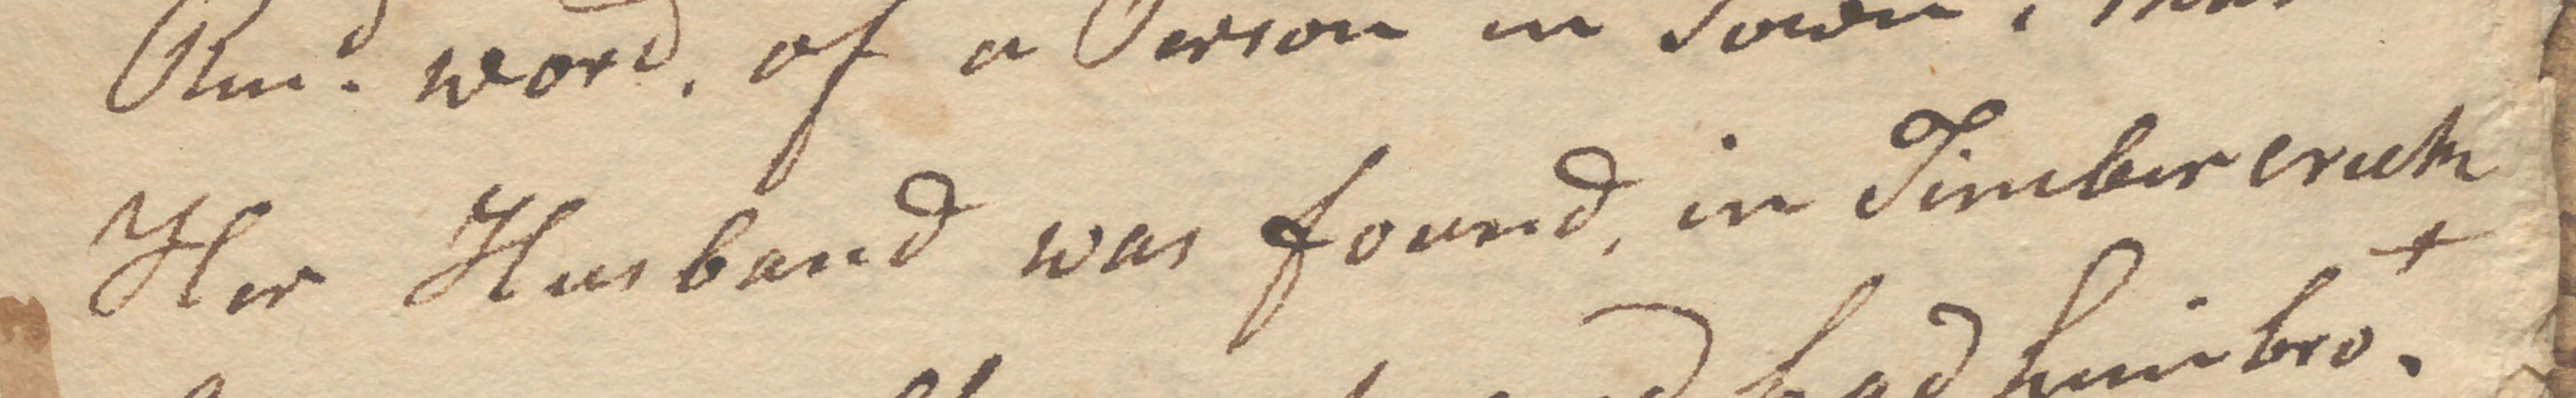Her Husband was found, in Timber creek
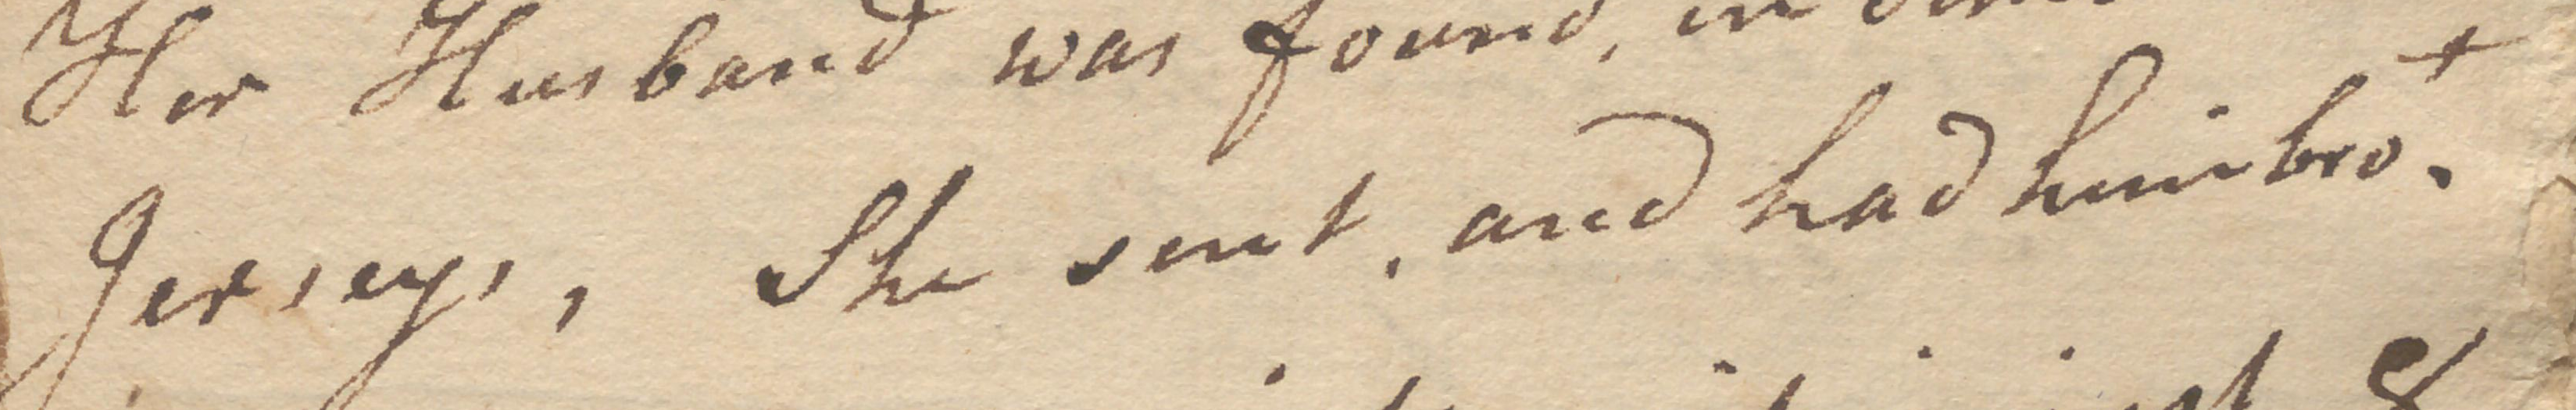Jerseys, She sent, and had him bro^t.
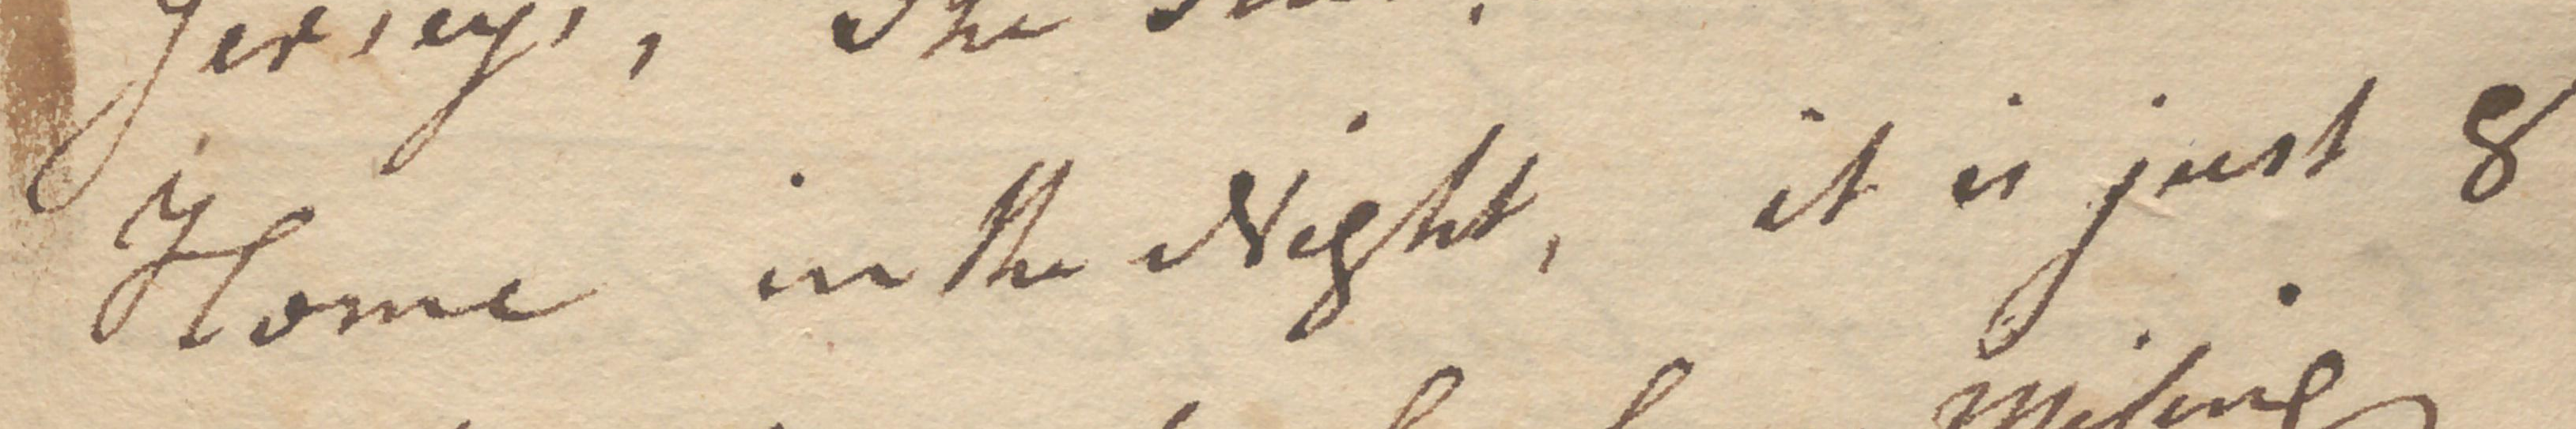Home, in the Night, it is just 8
